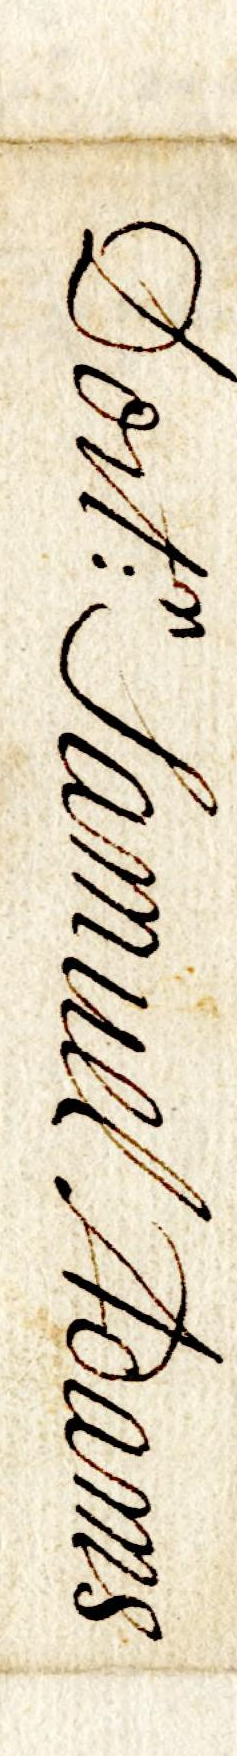Doct^r: Samuel Adams
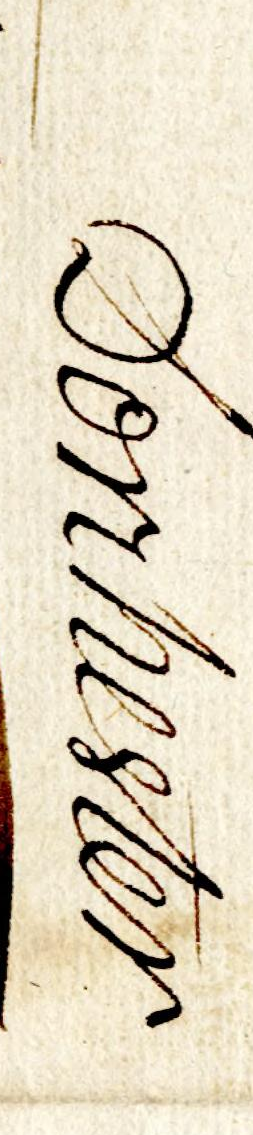Dorchester
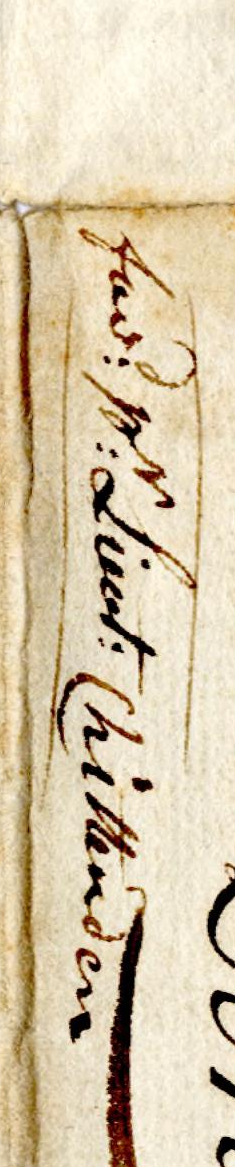fav^d: p^r: Lieut: Chittenden
